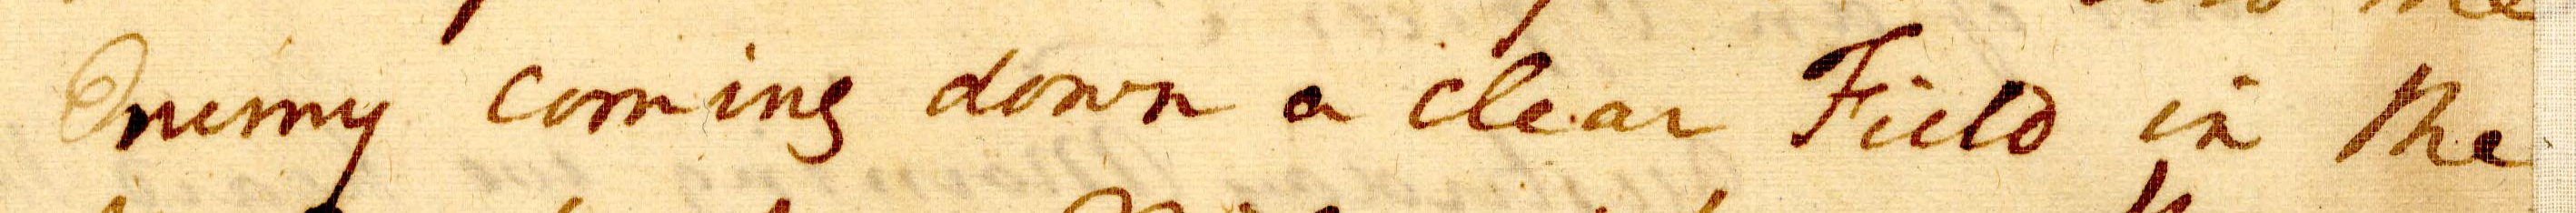Enemy coming down a clear Field in the
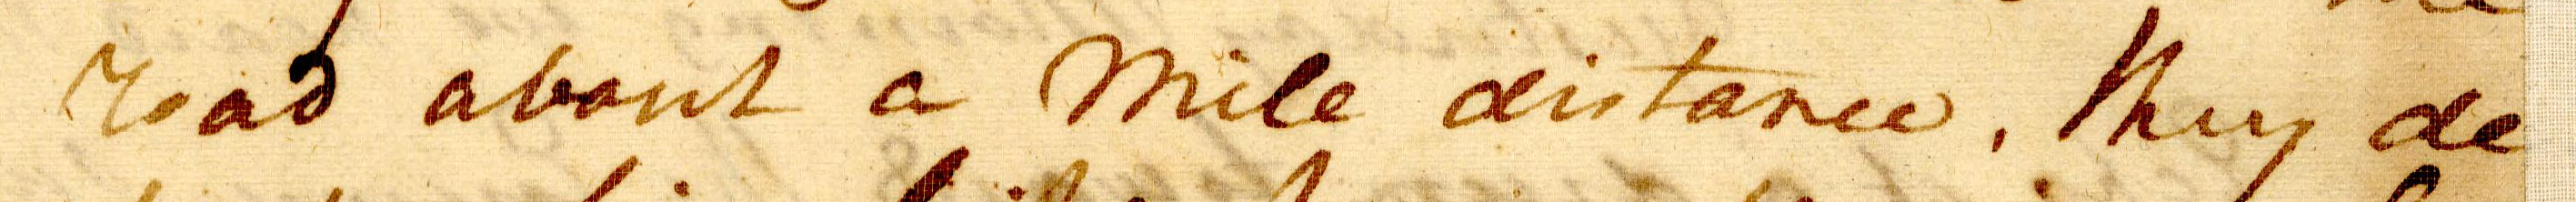road about a Mile distance, they de
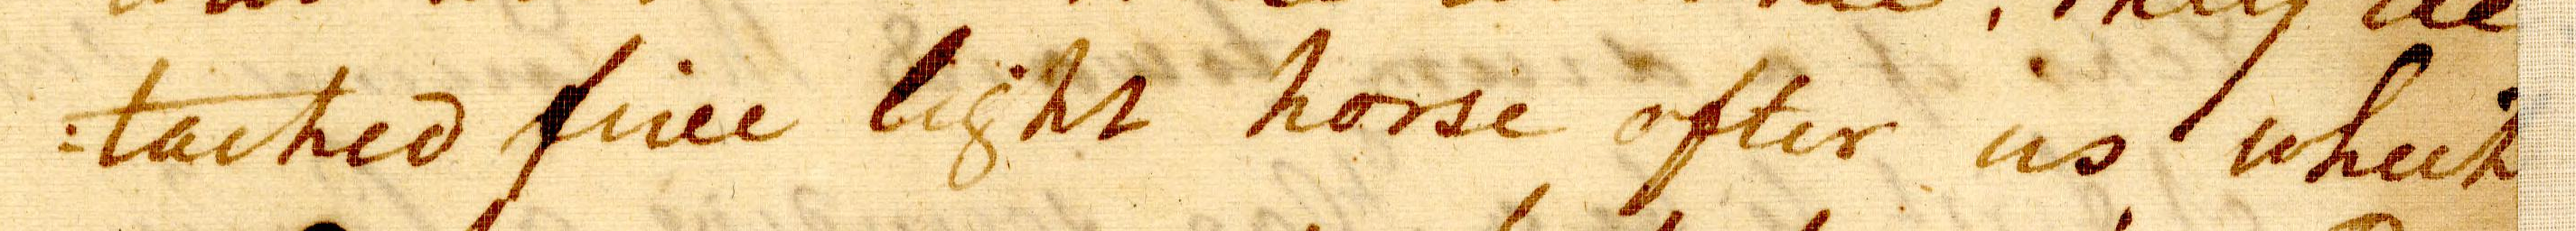-tached five light horse after us which
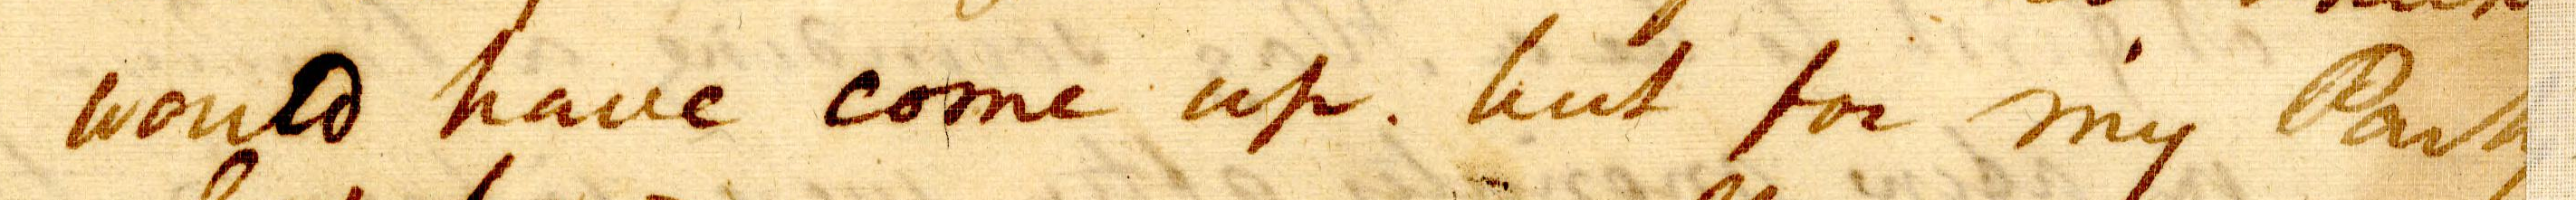would have come up but for my Party
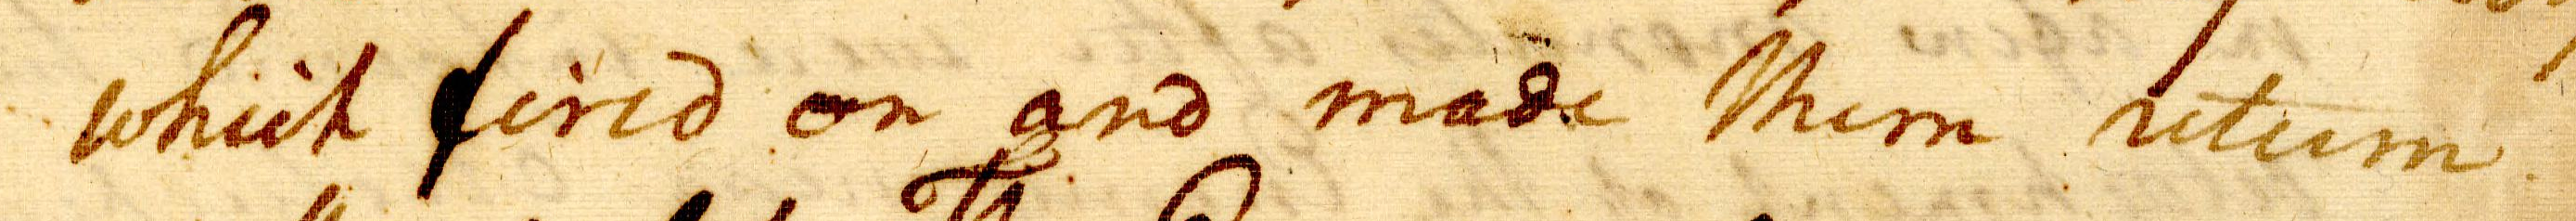which fired on and made them return
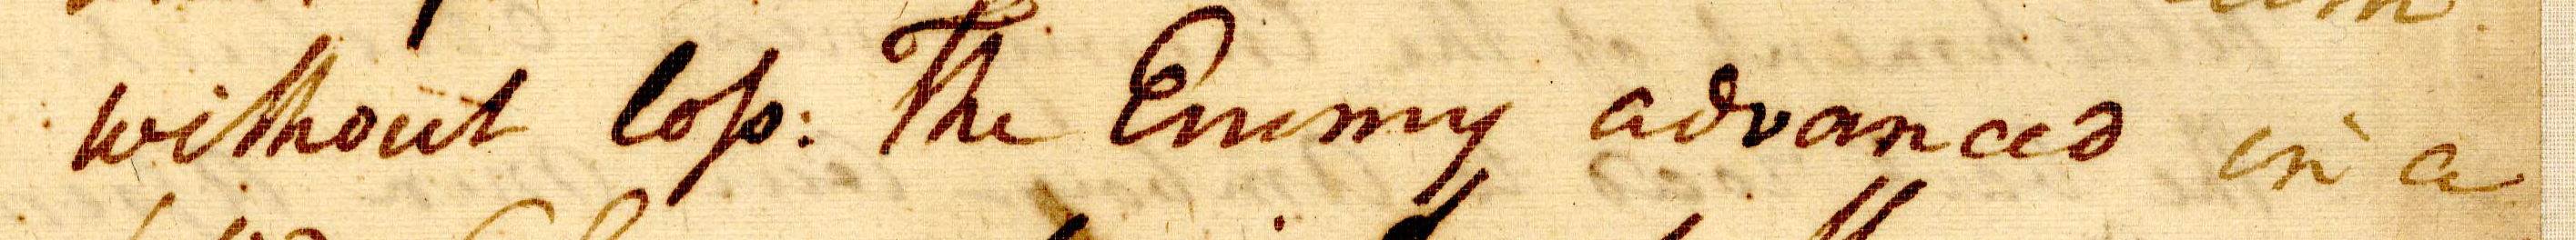without loss: The Enemy advanced in a
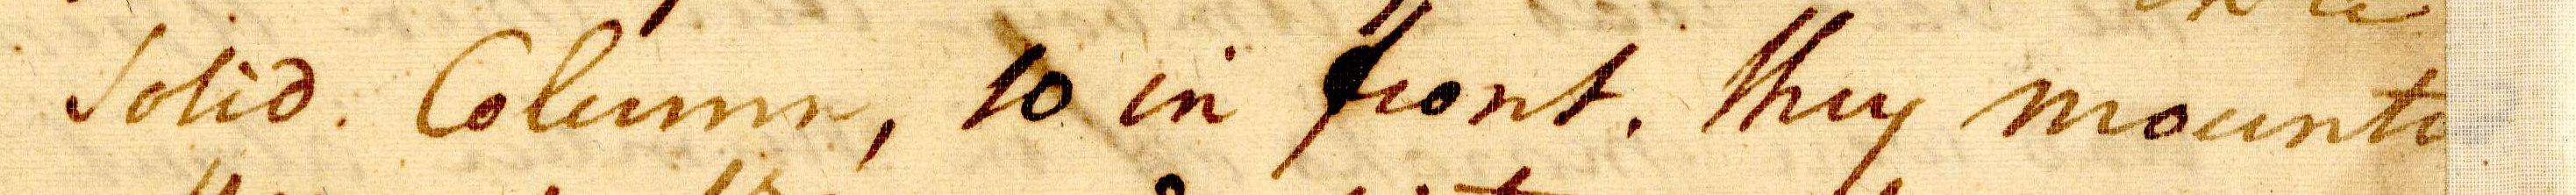Solid Column, 10 in front, they mounted
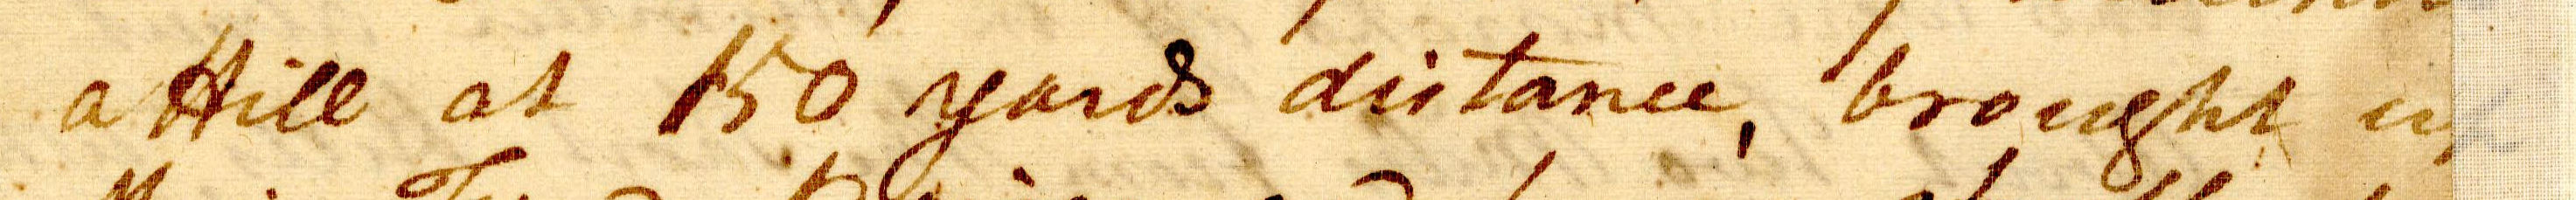a Hill at 150 yards distance brought up
